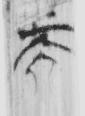而
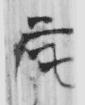厇
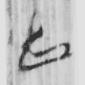㠯（以）
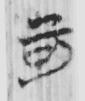可
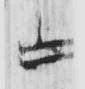士
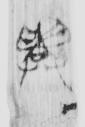興
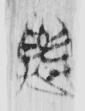𪴿
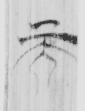而
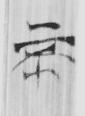不
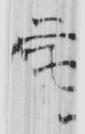厇
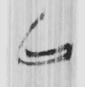㠯（以）
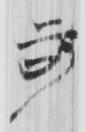可
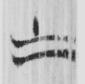士
